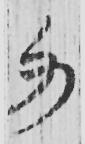力
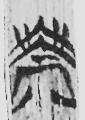{亠舛几}
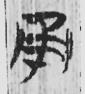甬
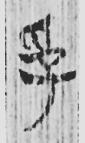孚
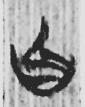自
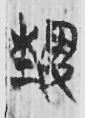{𡉣丮}
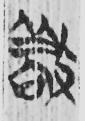敬
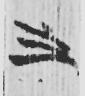之
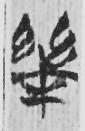𪪋（哉）
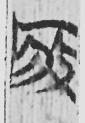{戶攴}（啟）
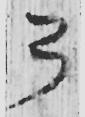乃
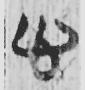心
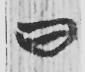日
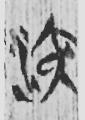沃
